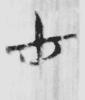才
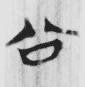公
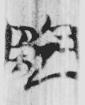陰
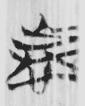者
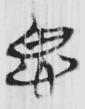思
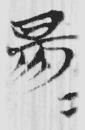昜=
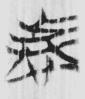者
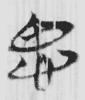思
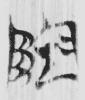陰
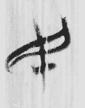民
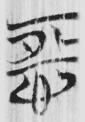{亙心}
